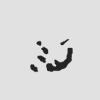出
